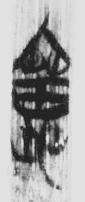○（蒐）
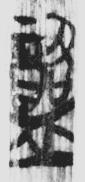○（酪）
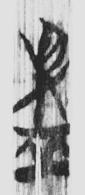○（菜）
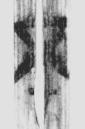不
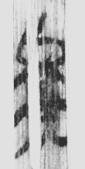○（酸）
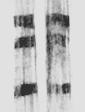王
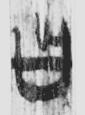曰
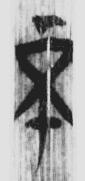不
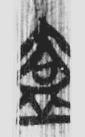盍（蓋）
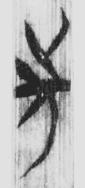先
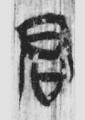君
